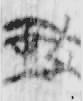玫
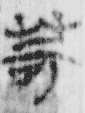苛
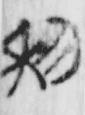利（利）
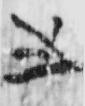之
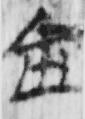金
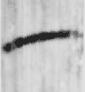一
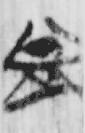益
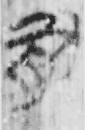刖
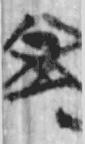益
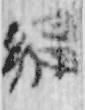○（纓）
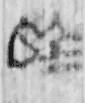爲
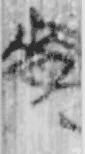李
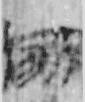所
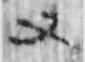又（有）
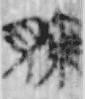責
